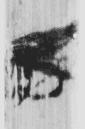{疒方}
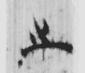之
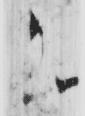人
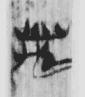萬
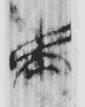民
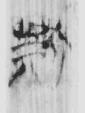斯
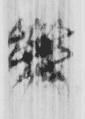樂
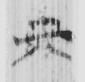亓
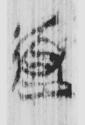道
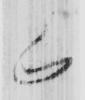㠯（以）
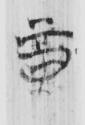章
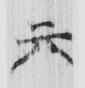亓
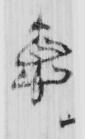惪
